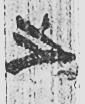之
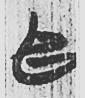𠂤
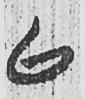㠯（以）
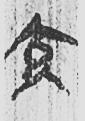交
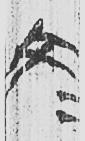文=
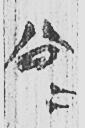公=
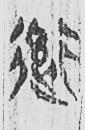{行幺止}
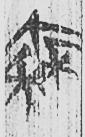秦
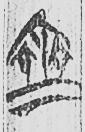齊
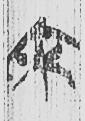宋
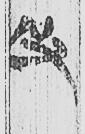及
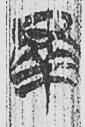群
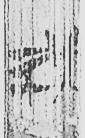戎
